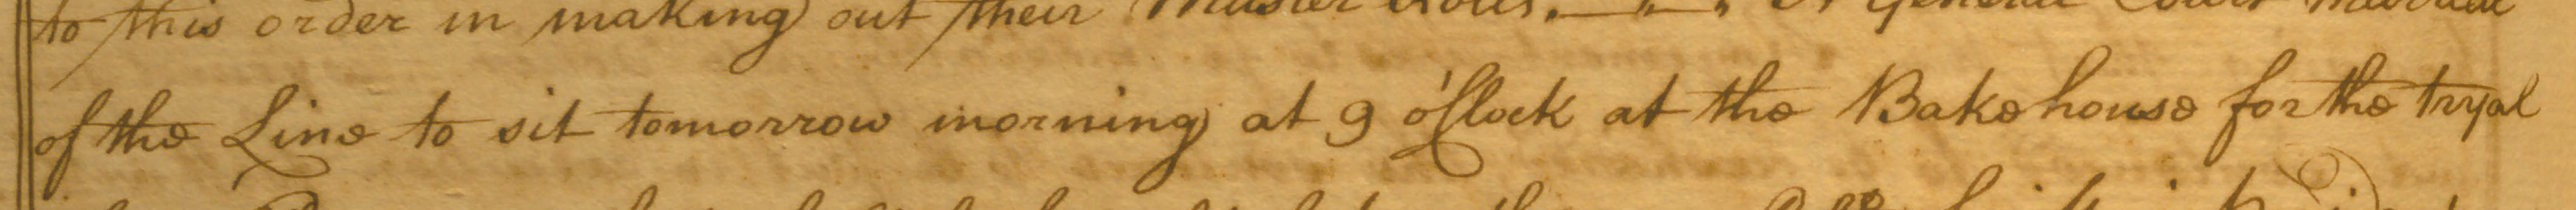of the Line to sit tomorrow morning at 9 o'Clock at the Bakehouse for the tryal
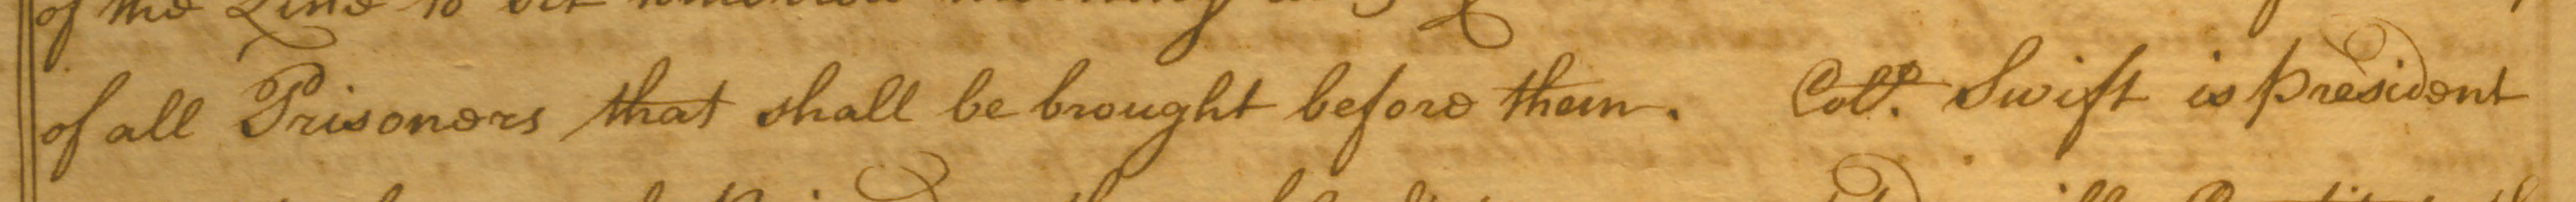of all Prisoners that shall be brought before them. Col^o. Swift is president
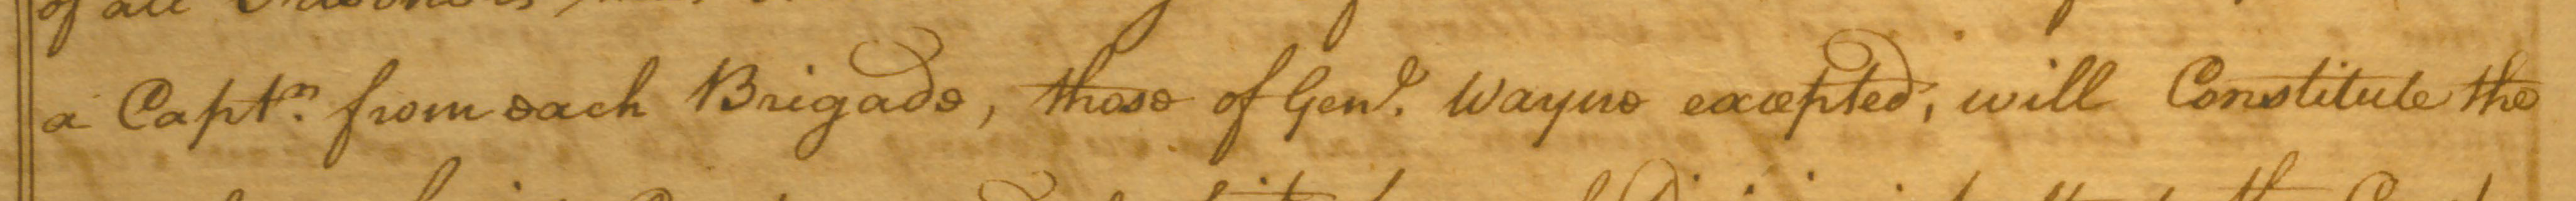a Capt^n. from each, those of Gen^l Wayne excepted, will Constitute the
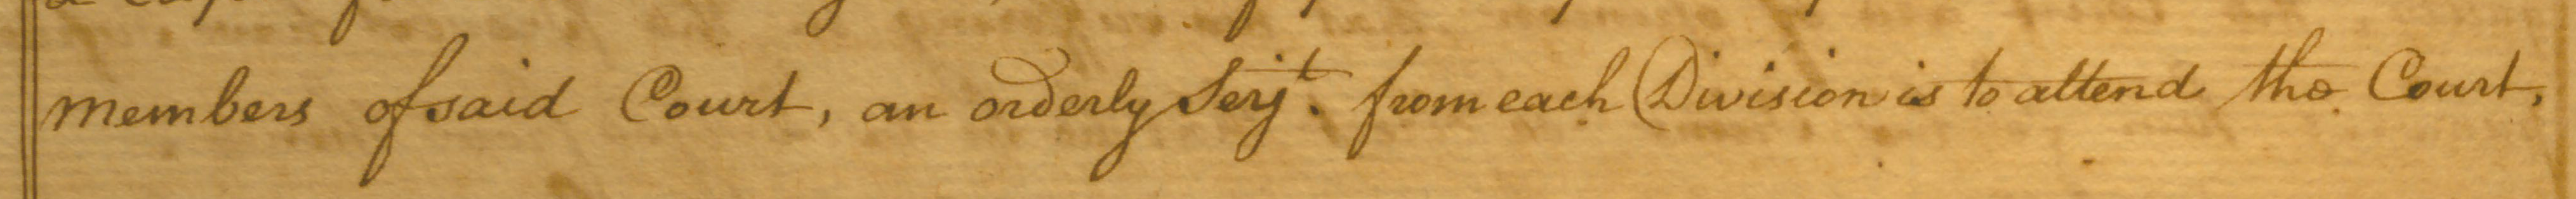members of said Court, an orderly Serj^t. from each Division is to attend the Court.
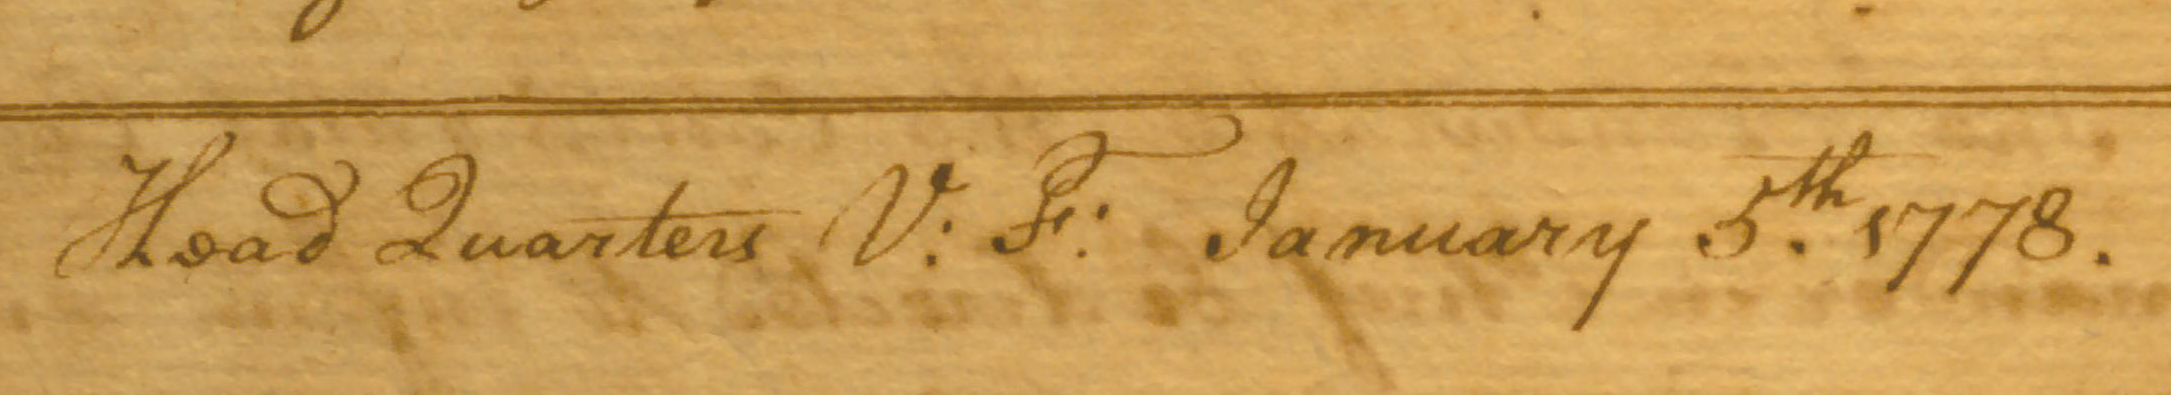Head Quarters V: F: January 5^th. 1778.
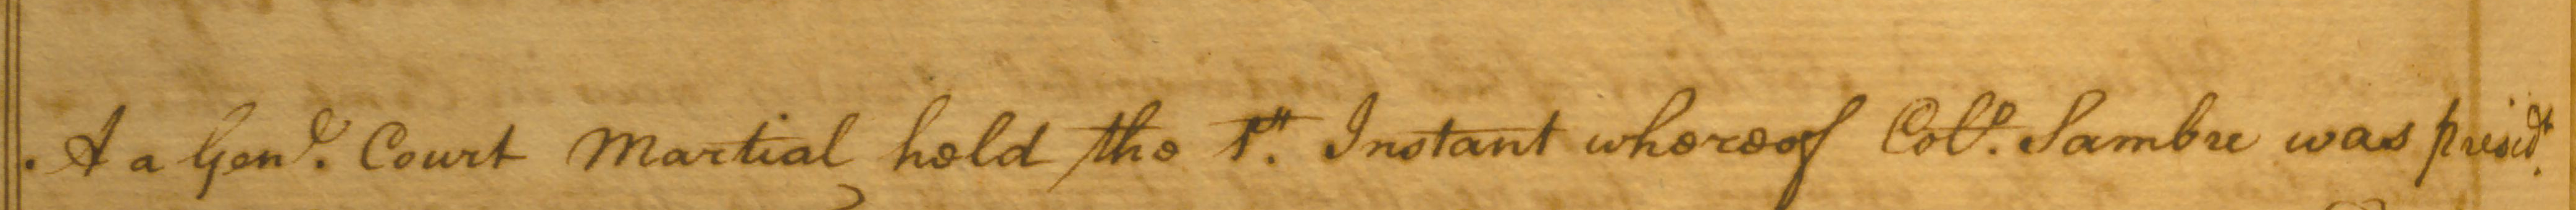A Gen^l. Court Martial held the 5^th. Instant whereof Col^o. Sambre was presid^t.
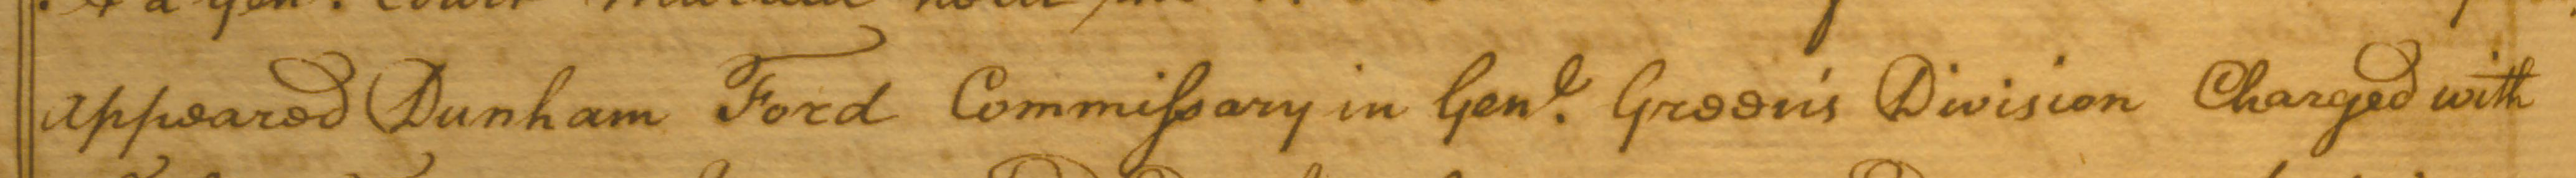appeared Dunham Ford Commissary in Gen^l. Green's Division Charged with
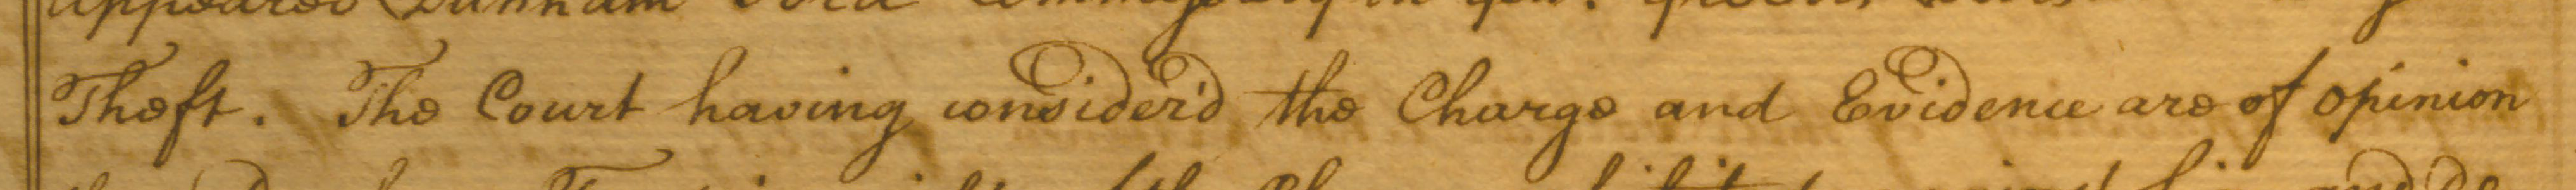Theft. The Court having considrer'd the Charge and Evidence are of opinion
